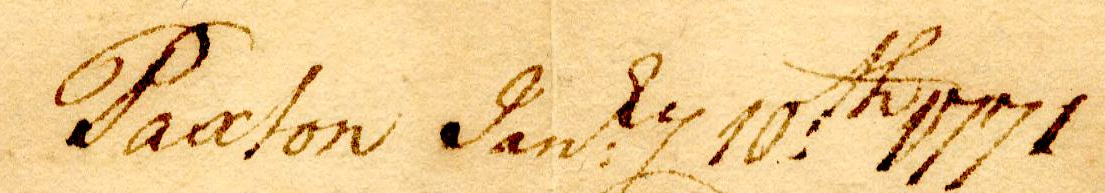Paxton Jan:^ry 10:^th 1771
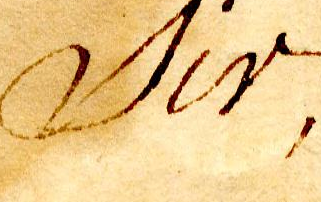Sir,
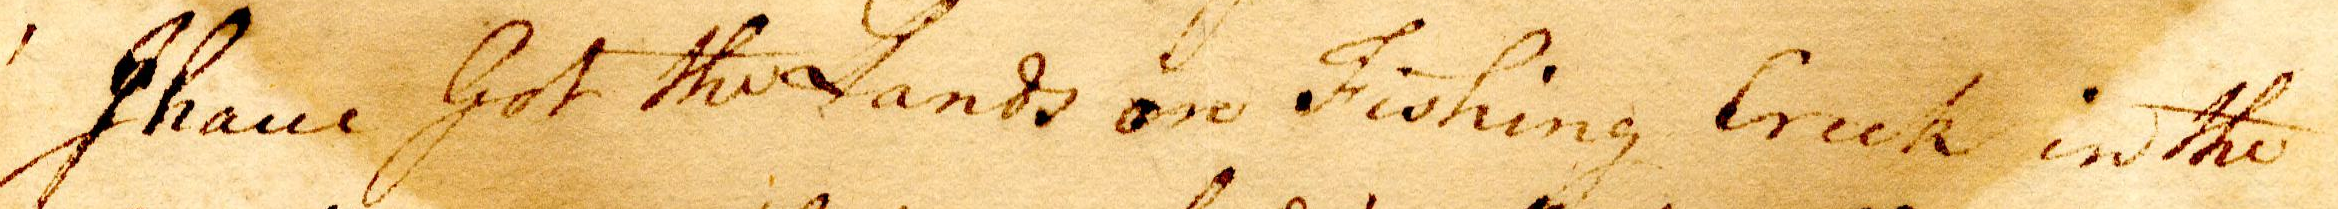I have Got the Lands one Fishing Creek in the
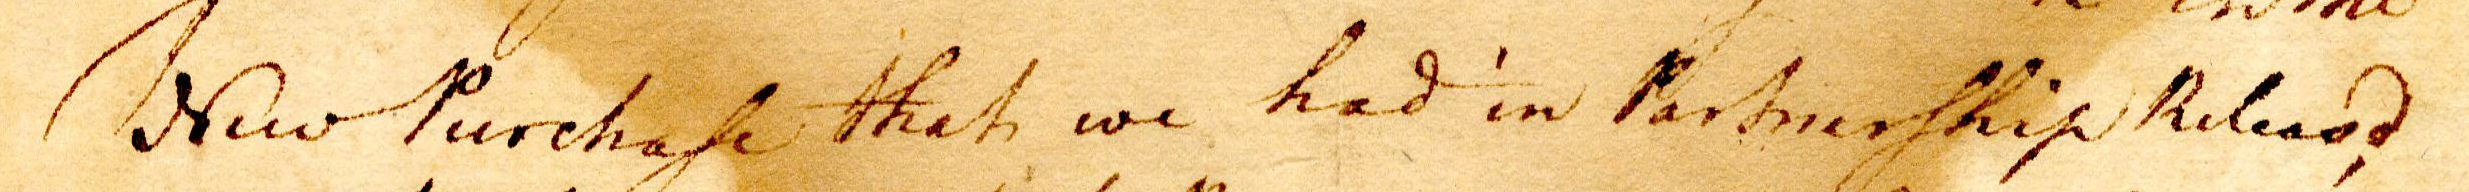New Purchase that we had in Partnership Releasd,
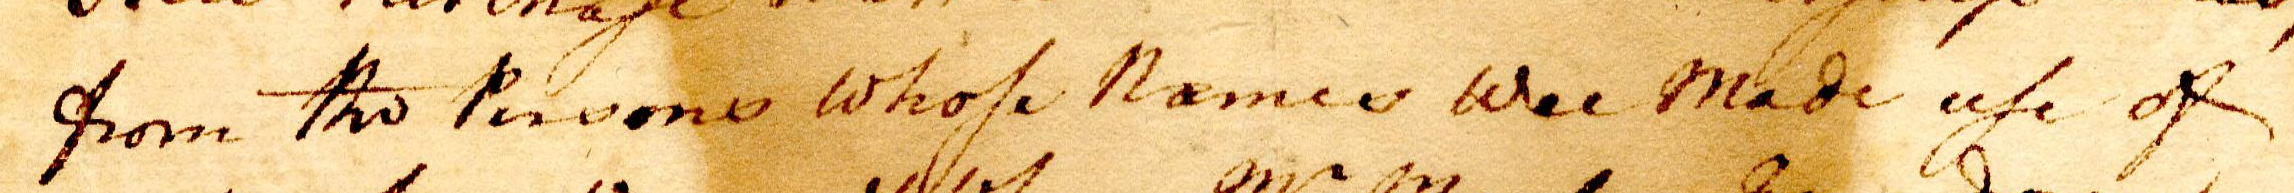from the Persons whose Names wee Made use of
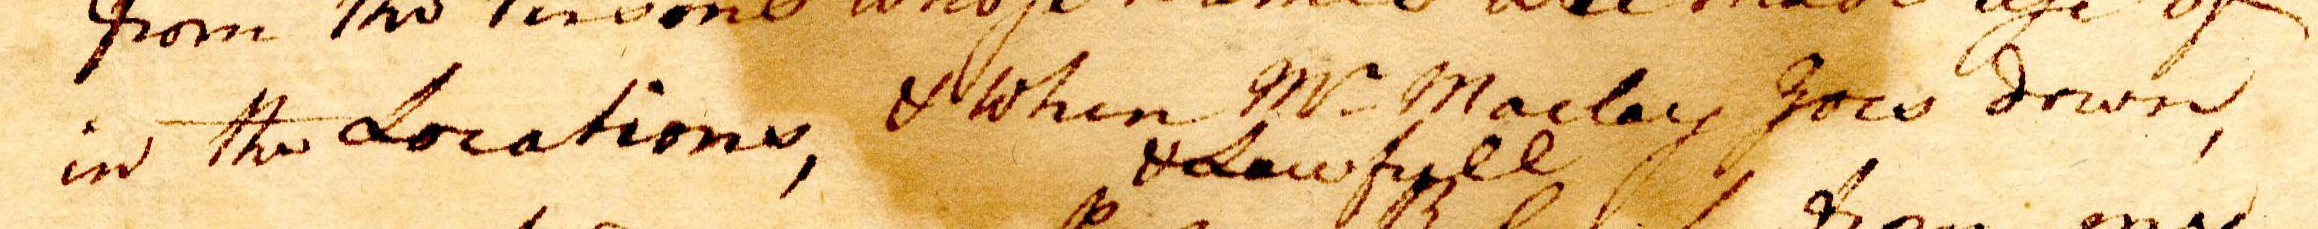in the Locations, & When M^r. Maclay goes down,
